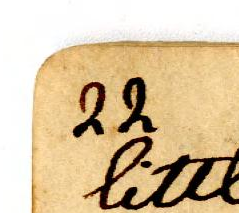22
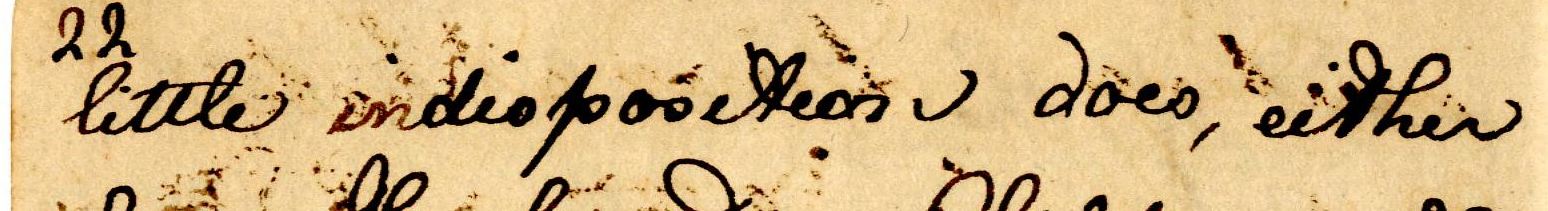little indispositions does, either
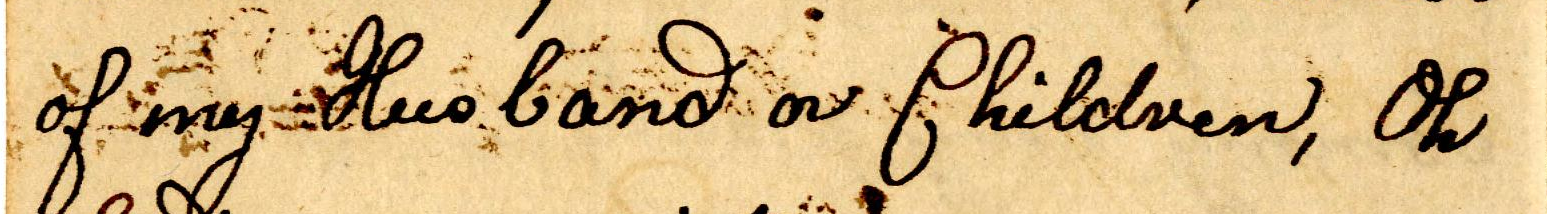of my Husband or Children, Oh
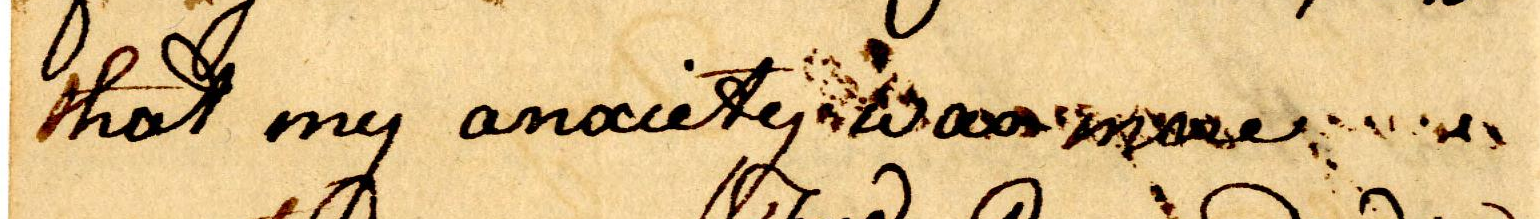that my anxiety was more
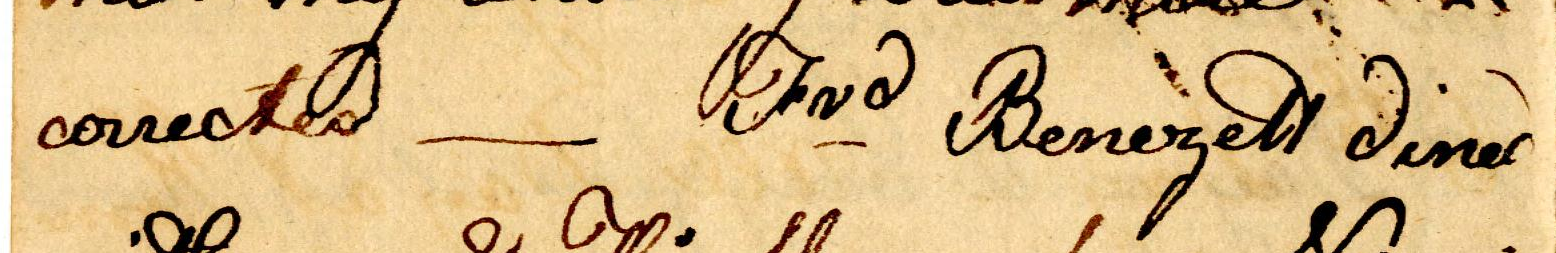corrected- F^rd Benezett dined
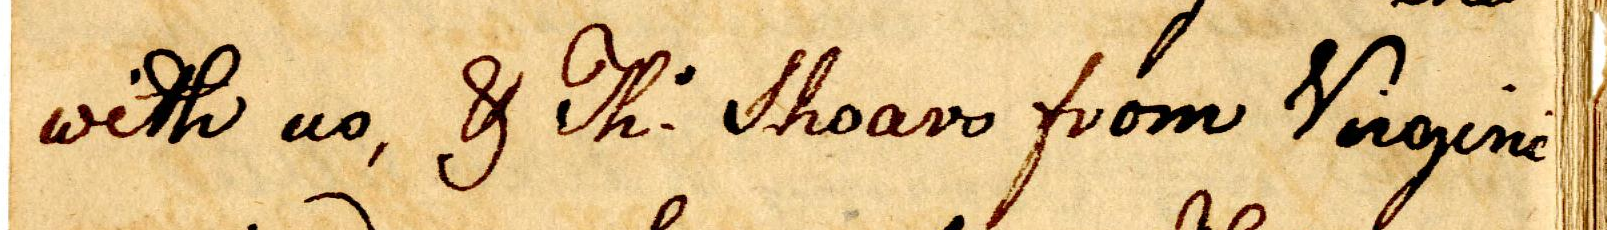with us, & Th^s Shoars from Virgini
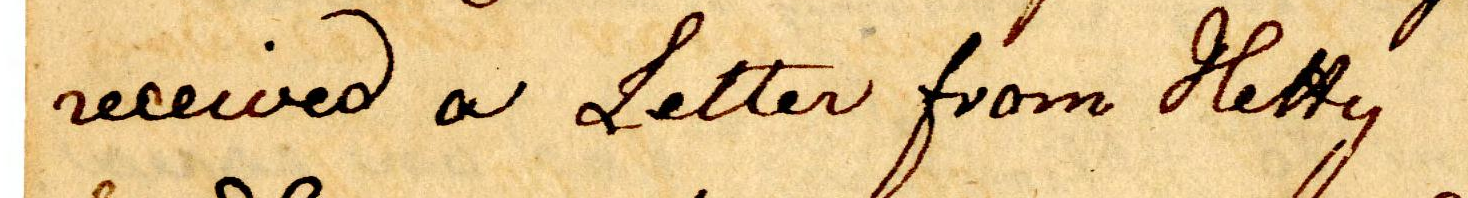received a Letter from Hetty
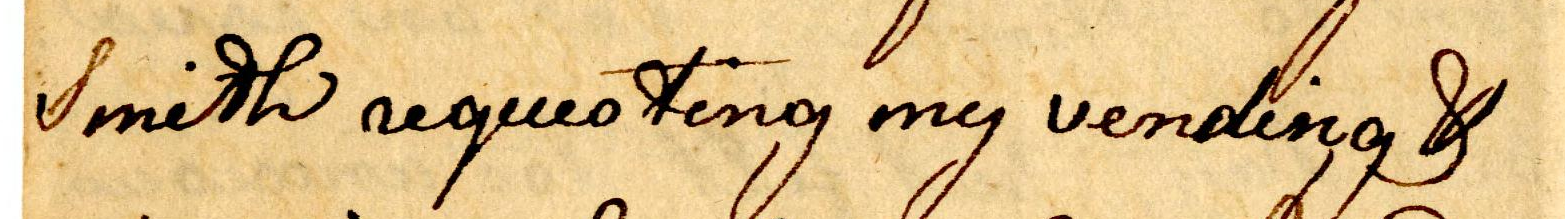Smith requesting my vending &
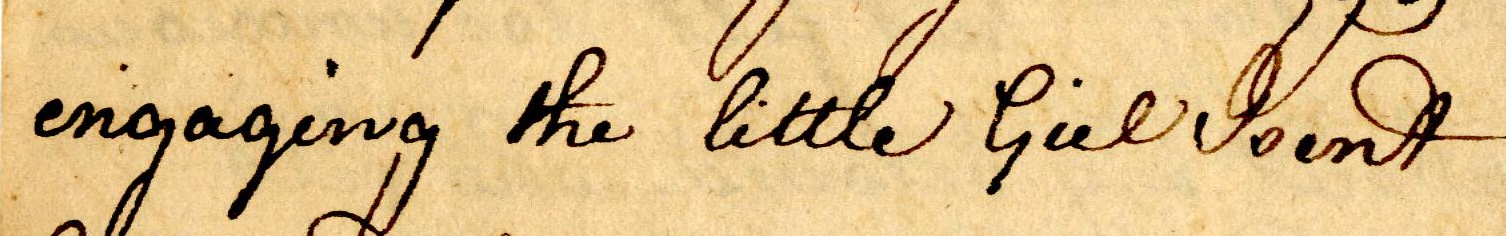engaging the little Girl I sent
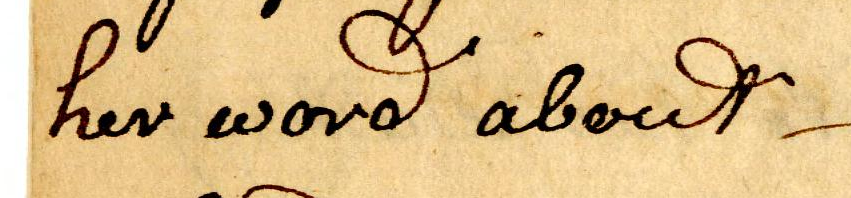her word about
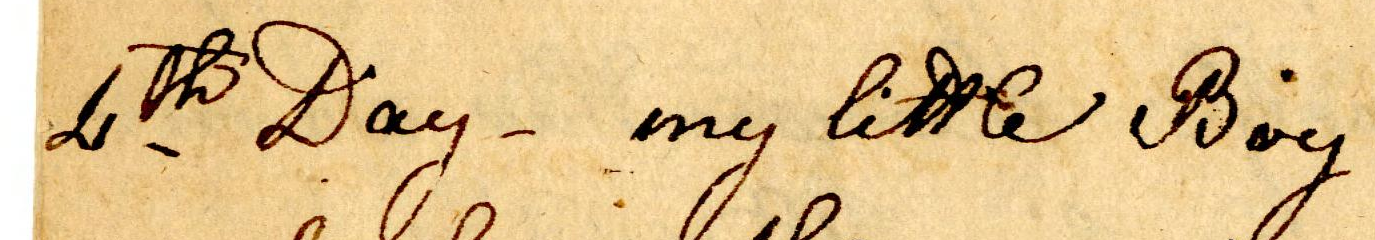4^th Day- my little Boy
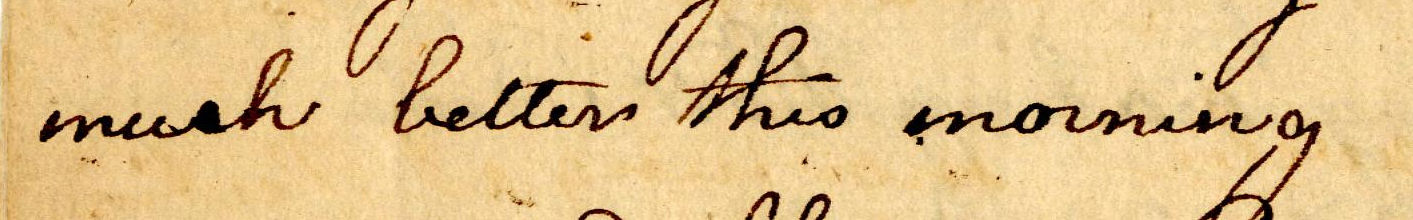much better this morning
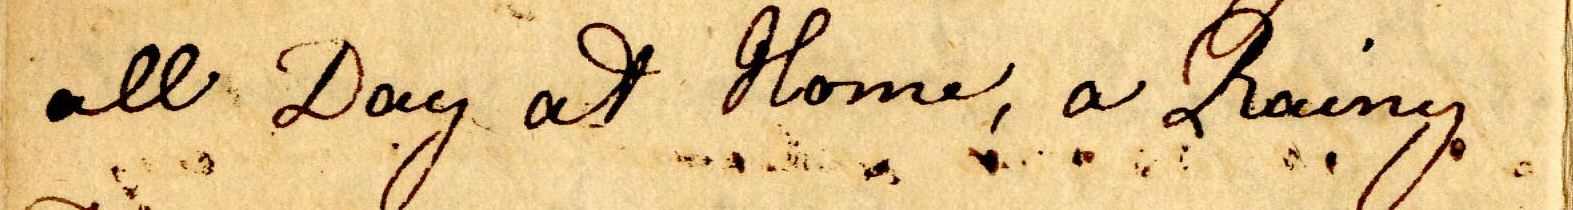all Day at Home, a Rainy
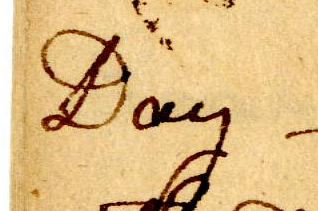Day-
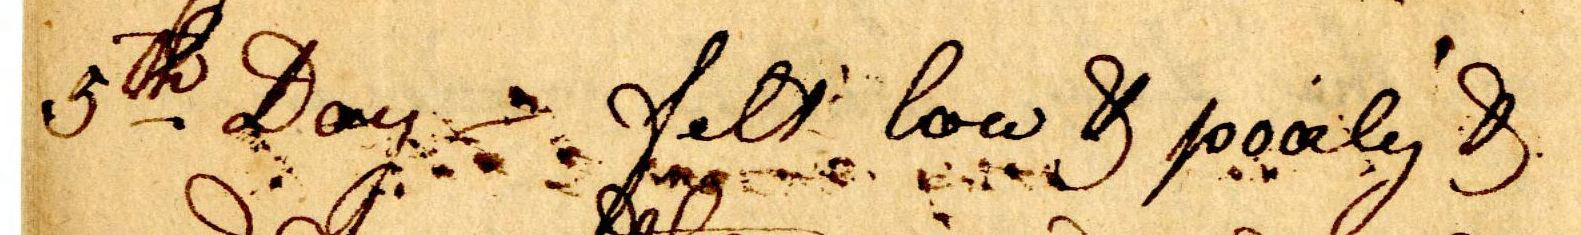5^th Day- felt low & poorly &
